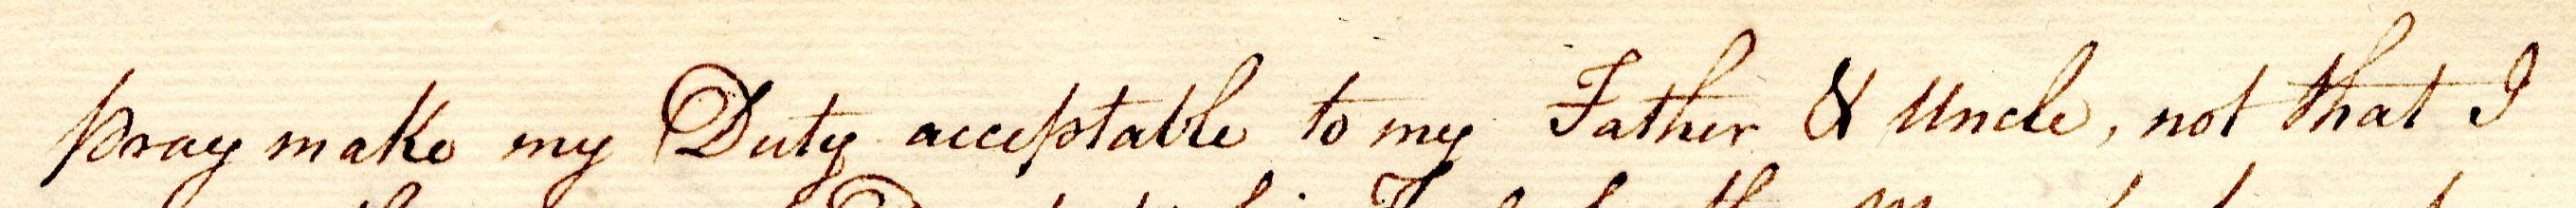pray make my Duty acceptable to my Father & Uncle, not that I
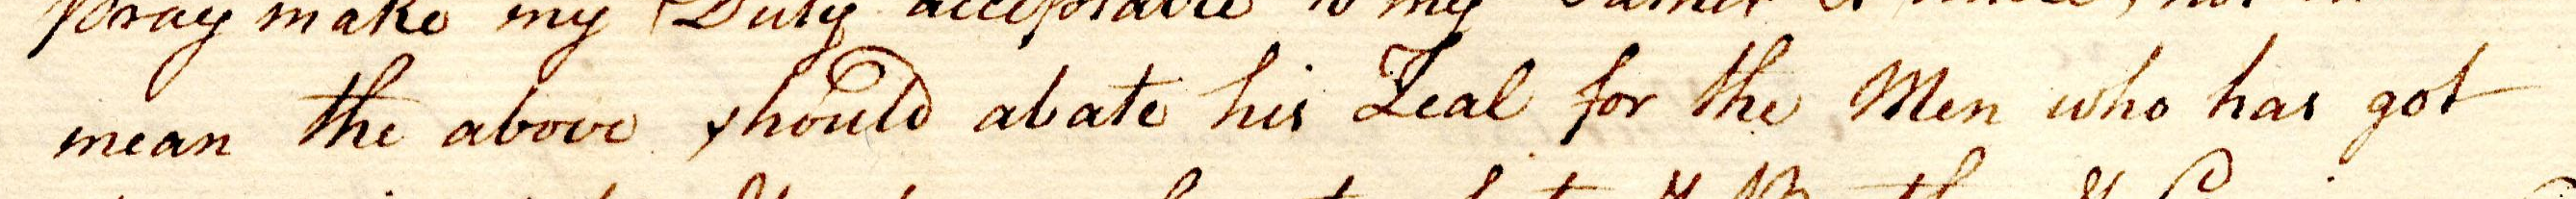mean the above should abate his Zeal for the Men who has got
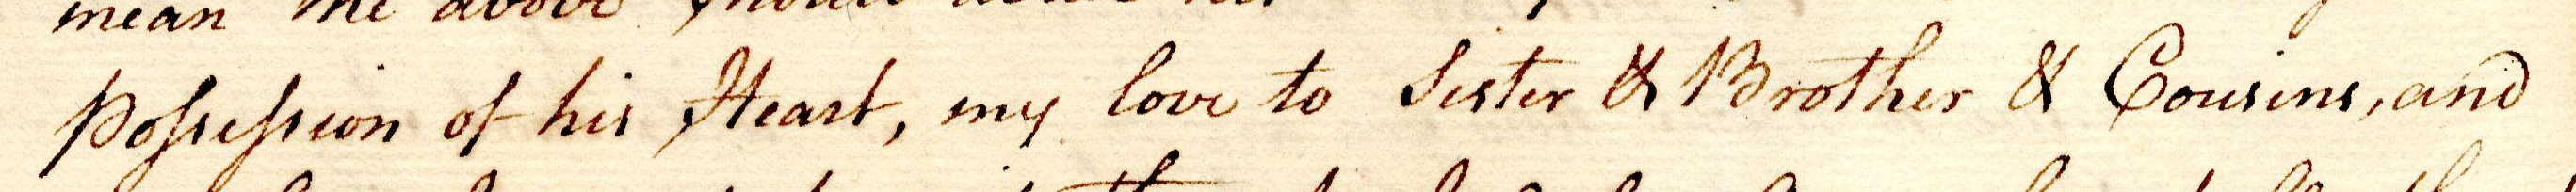possession of his Heart, my love to Sister & Brother & Cousins, and
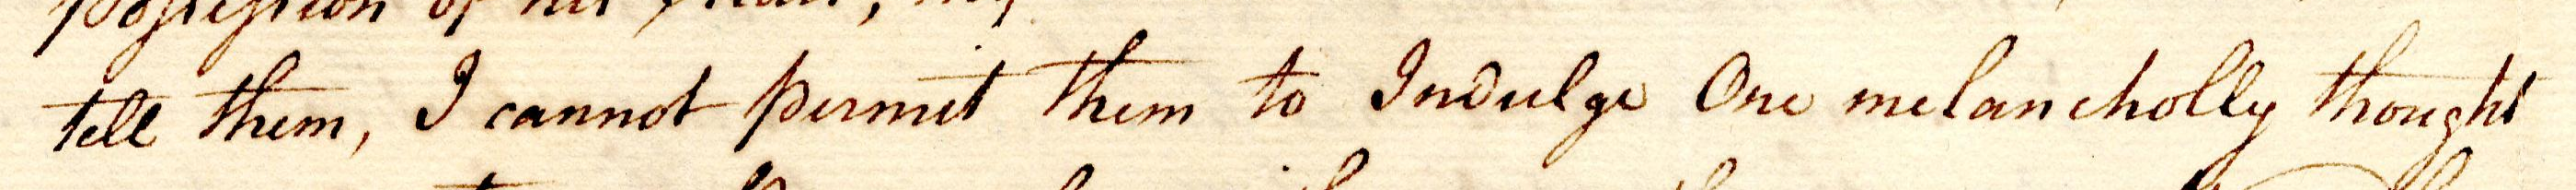tell them, I cannot permit them to Indulge One melancholly thought
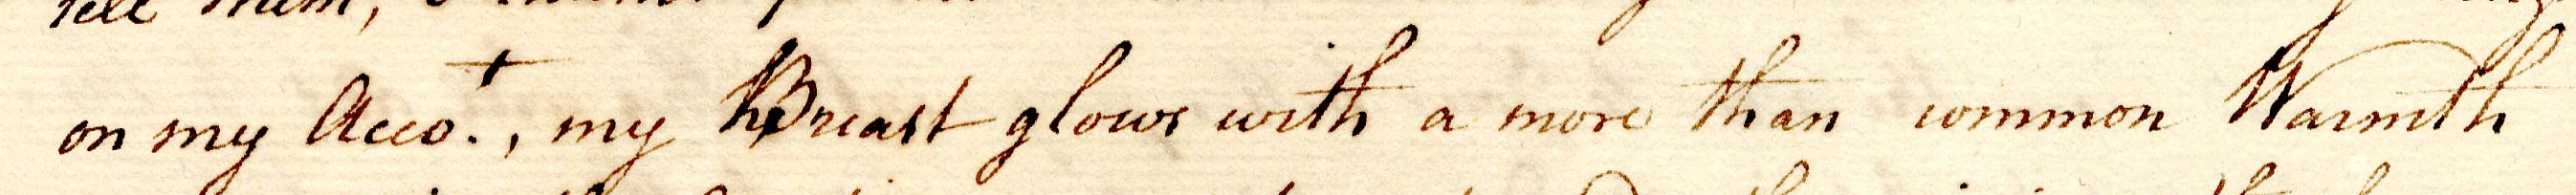on my Acco^t, my Breast glows with a more than common Warmth
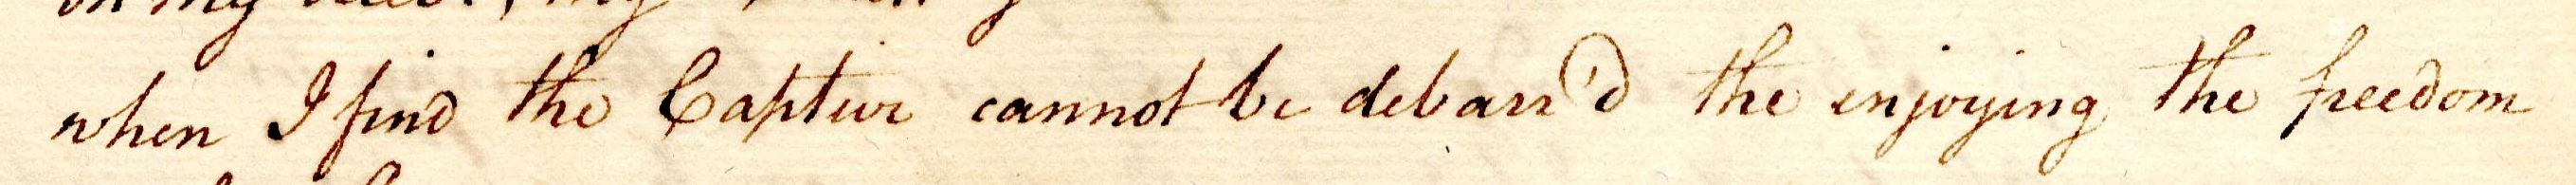when I find the Captur cannot be debarr'd the enjoying the freedom
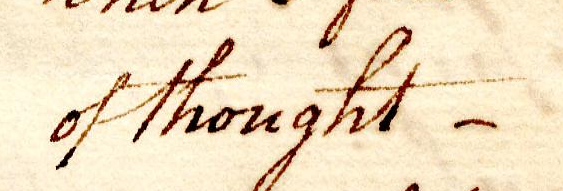of thought.
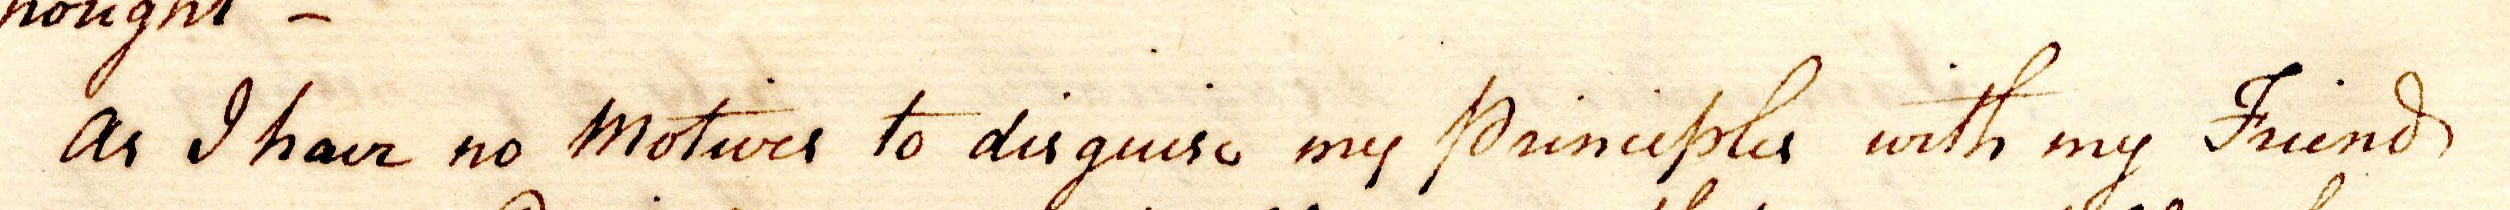As I have no motives to disguise my principles with my Friend
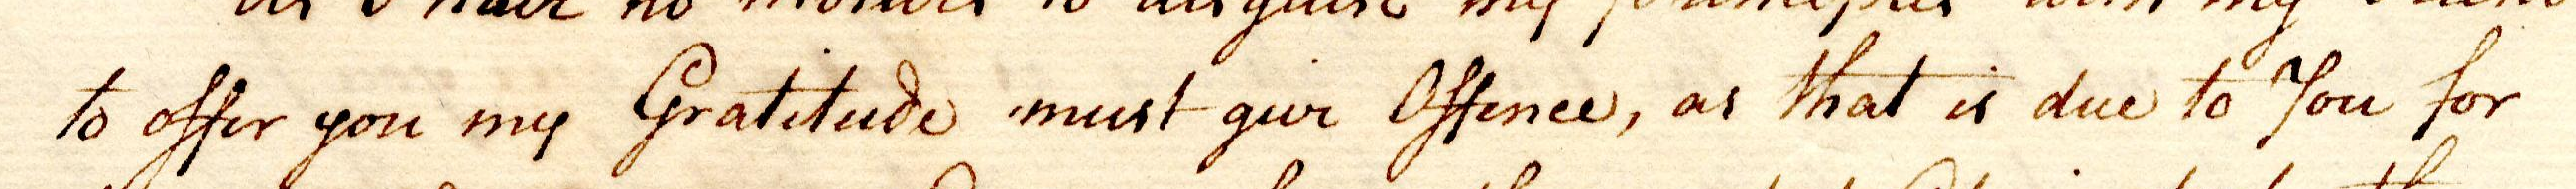to offer you my Gratitude must give Offence, as that is due to You for
